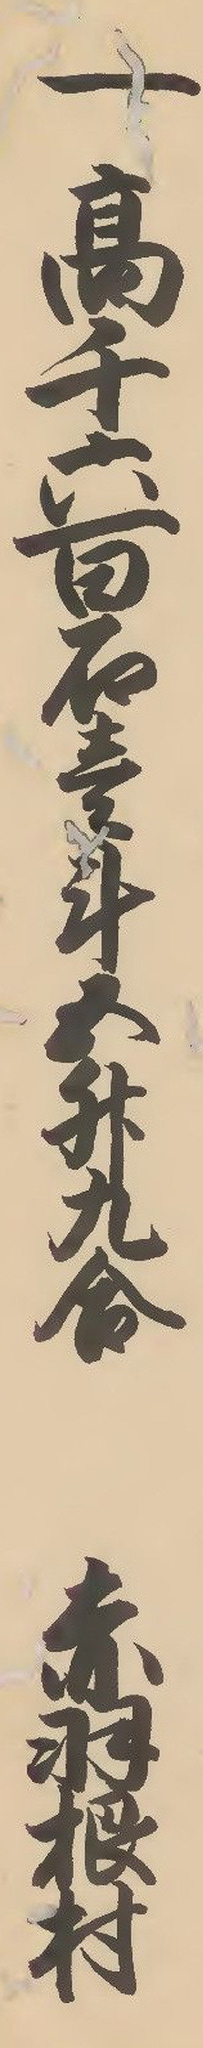一高千六百石壱斗五升九合赤羽根村
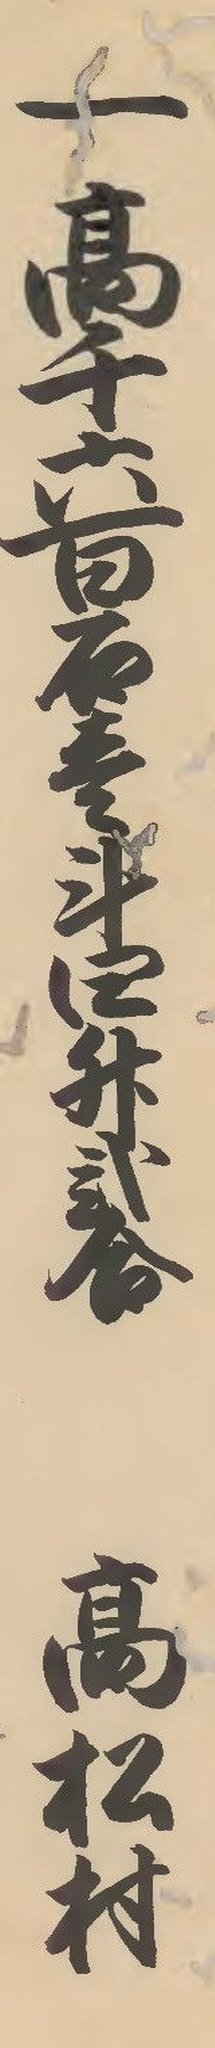一高千六百石壱斗四升弐合高松村
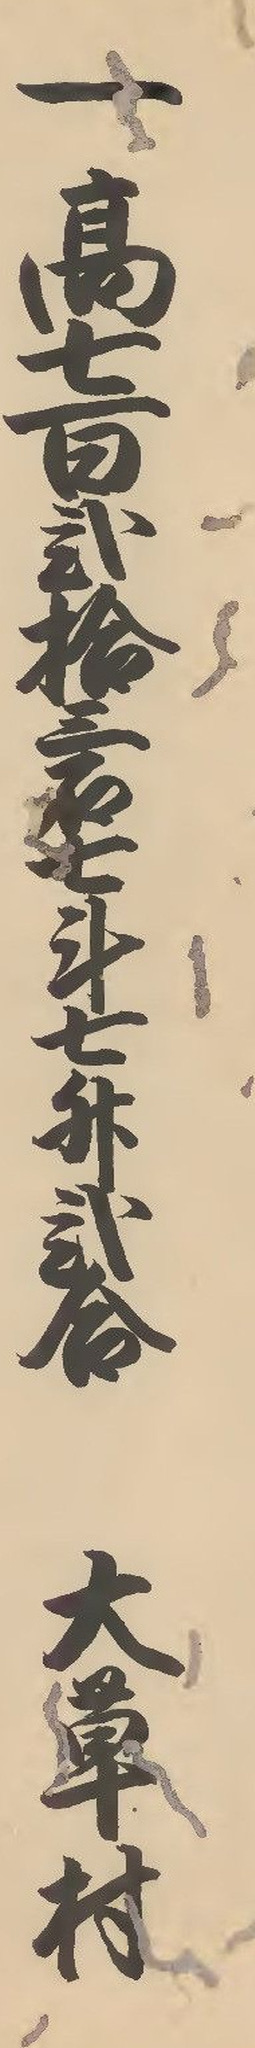一高七百弐拾三石七斗七升弐合大草村
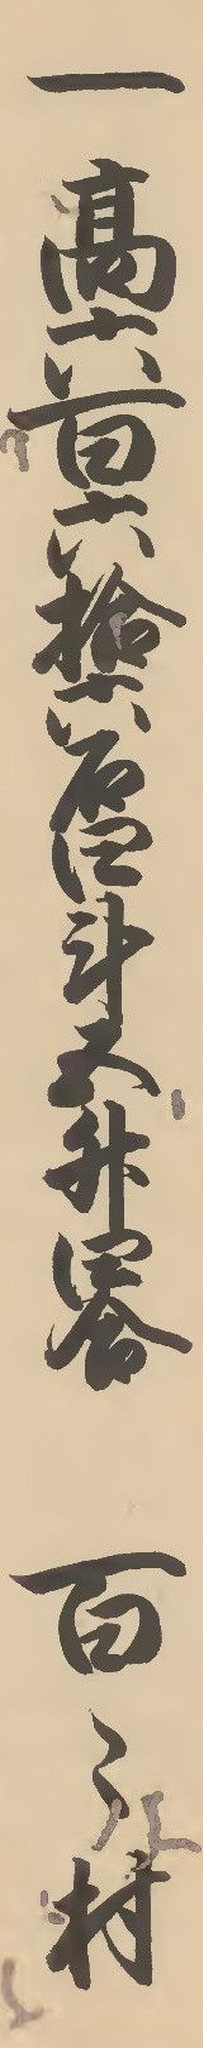一高六百六拾六石四斗五升四合百々村
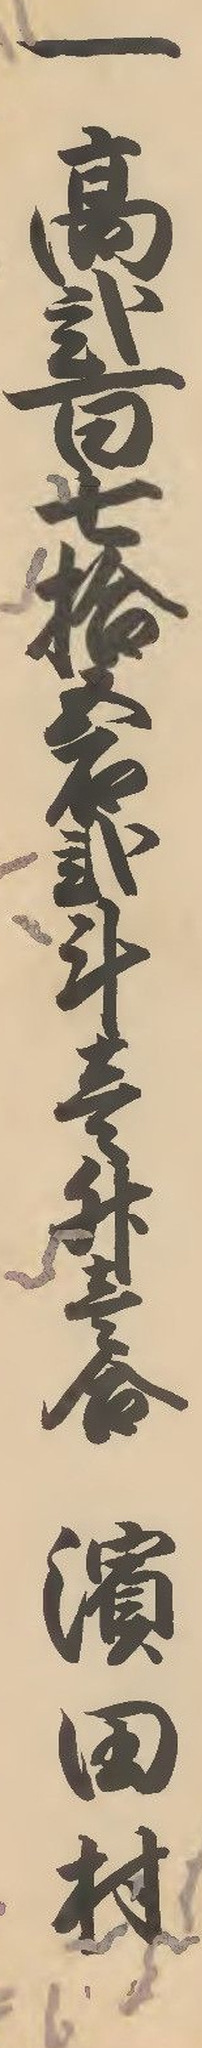一高弐百七拾五石弐斗壱升壱合浜田村

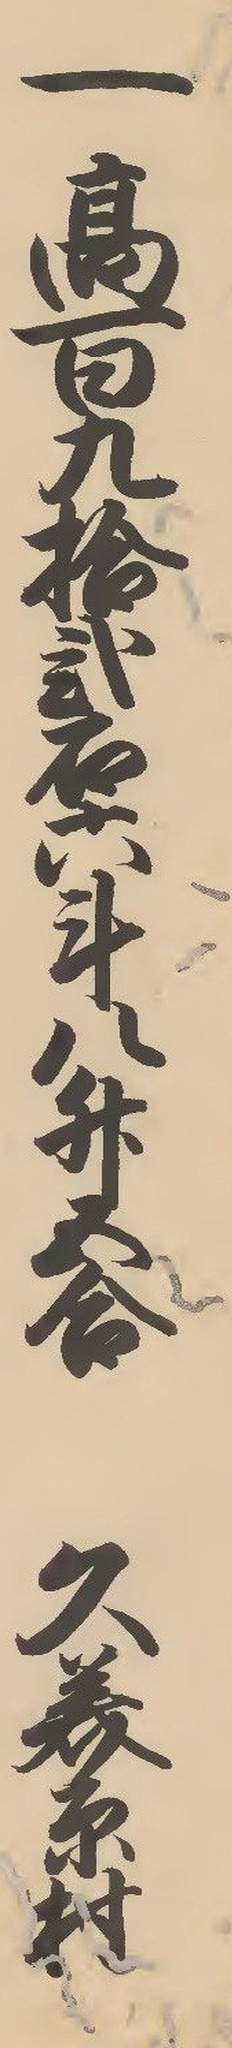一高百九拾弐石六斗八升五合久美原村
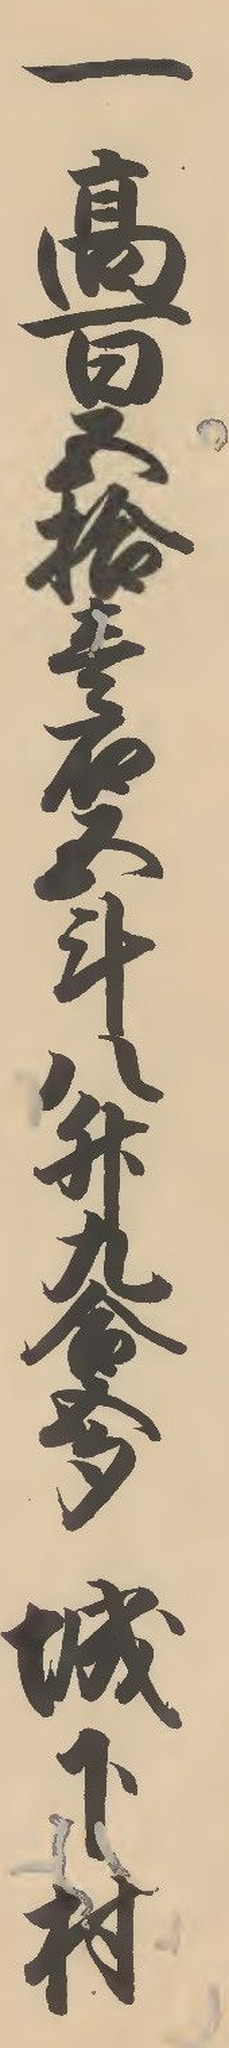一高百五拾壱石五斗八升九合五勺城下村
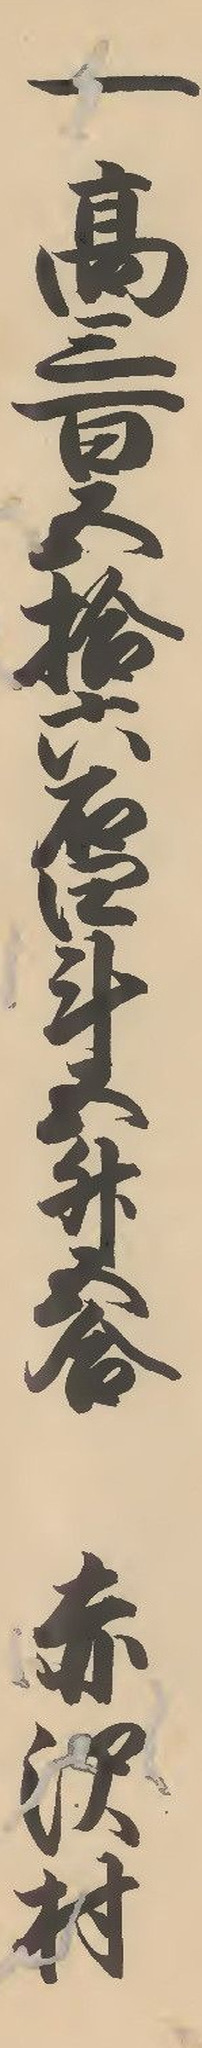一高三百五拾六石四斗五升五合赤沢村
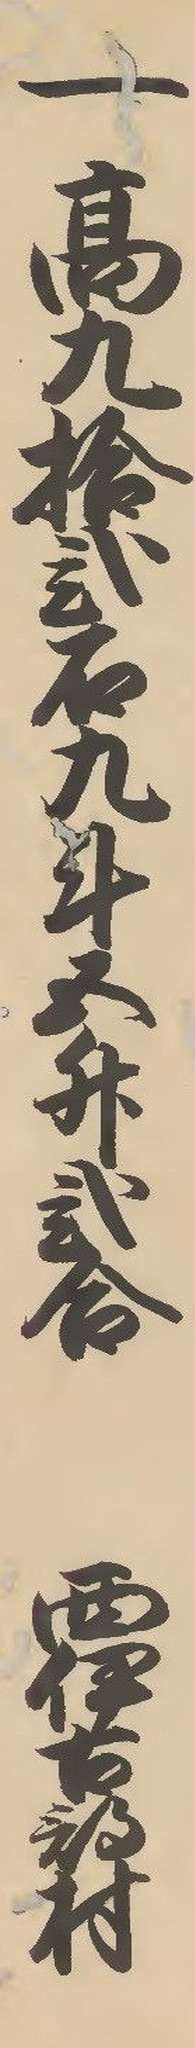一高九拾弐石九斗五升弐合西伊古部村
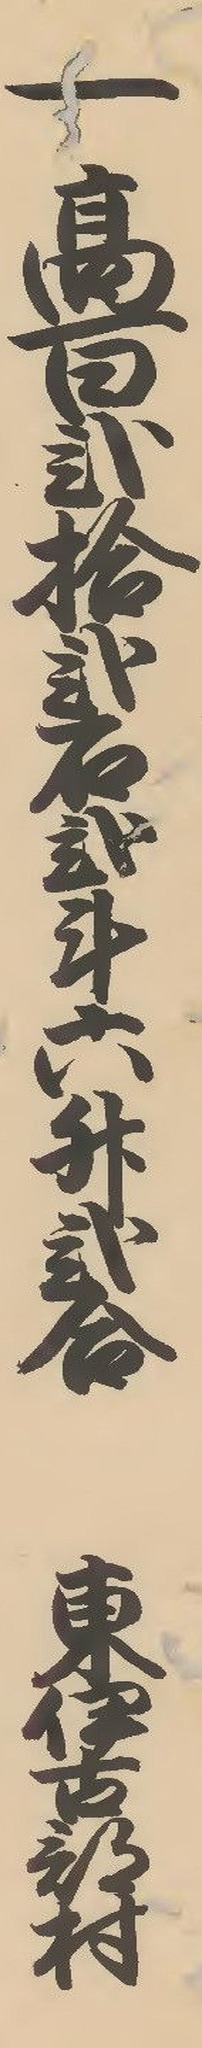一高百弐拾弐石弐斗六升弐合東伊古部村
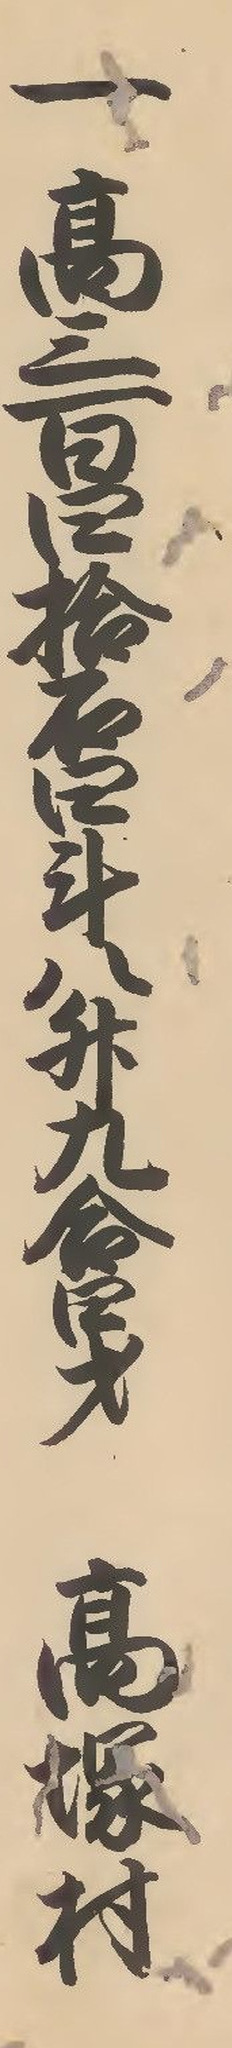一高三百四拾石四斗八升九合四才高塚村
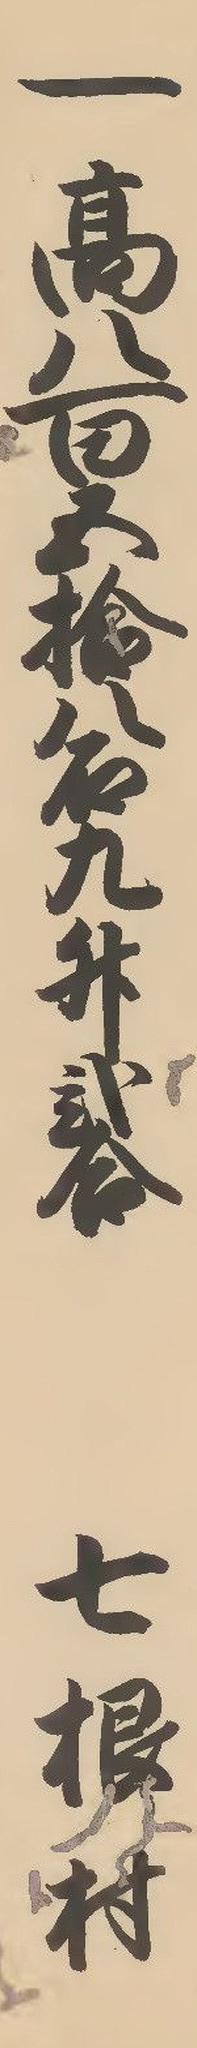一高八百五拾八石九升弐合七根村
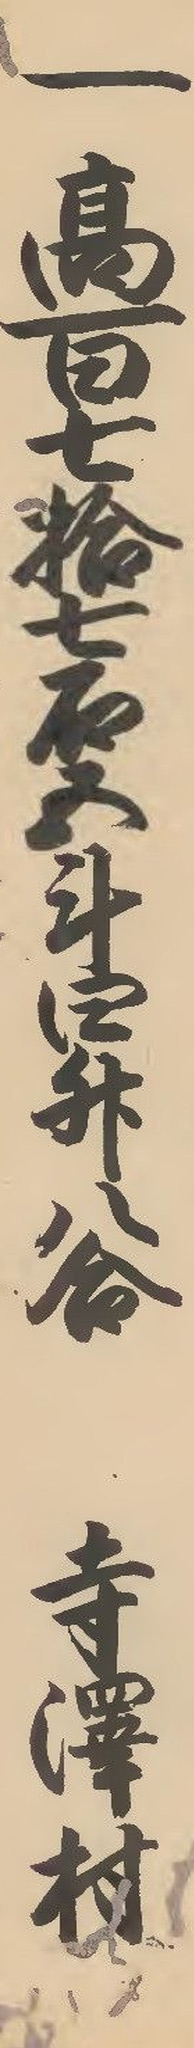一高百七拾七石五斗四升八合寺沢村

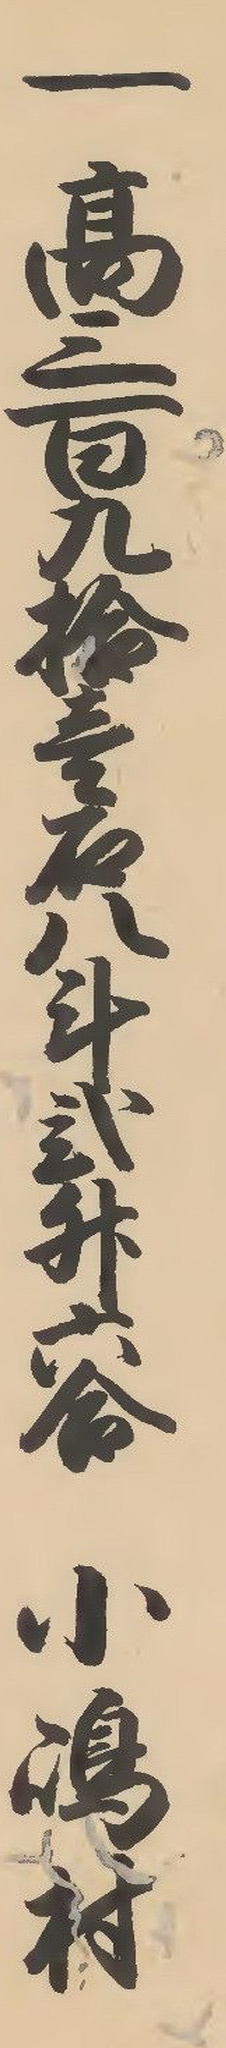一高三百九拾壱石八斗弐升六合小島村
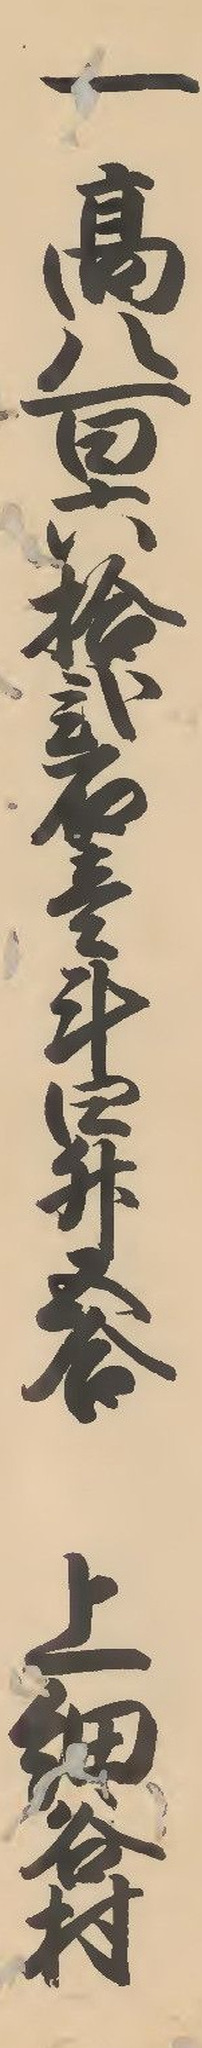一高八百六拾弐石壱斗四升五合上細谷村
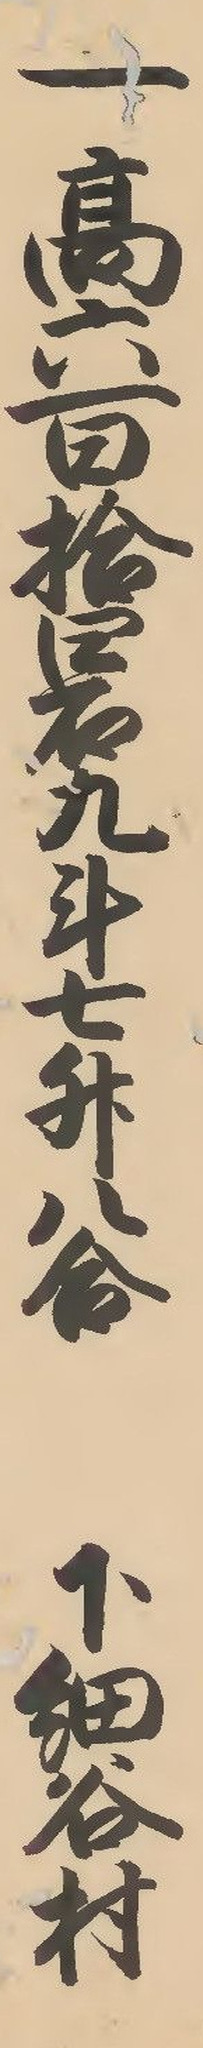一高六百拾四石九斗七升八合下細谷村
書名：三河国郷帳
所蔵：国立公文書館 National Archives of Japan
